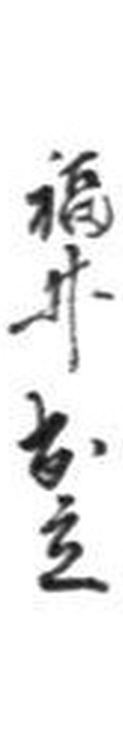福井出立
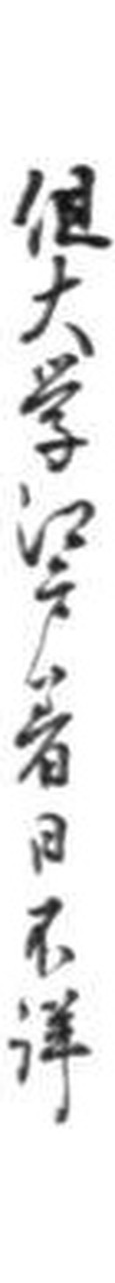但大学江戸着日不詳
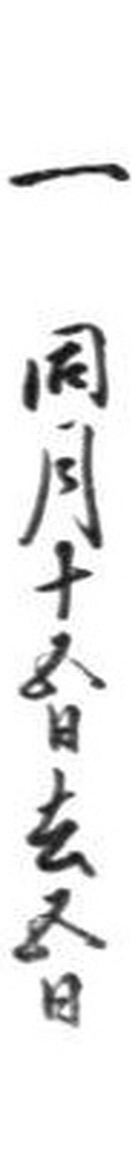一同月十五日去五日
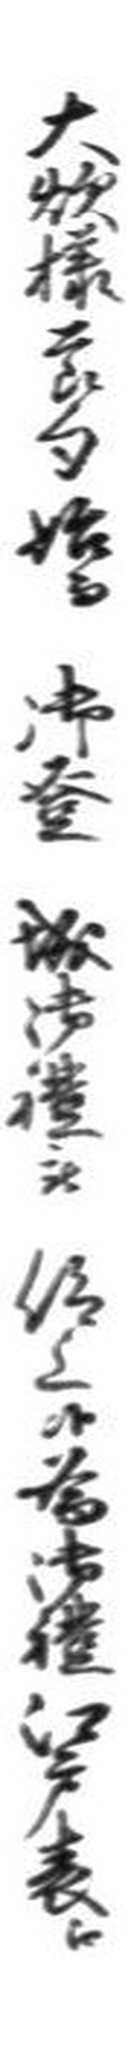大炊様節句始而御登城御礼被仰上候為御礼江戸表江
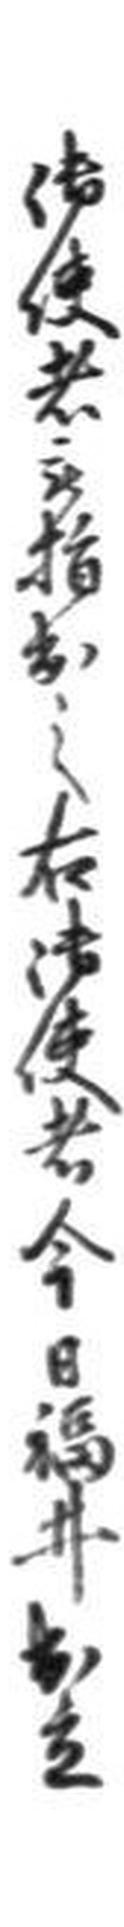御使者被指出之右御使者今日福井出立
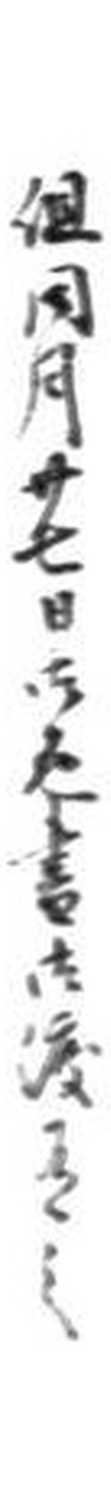但同月廿七日御返書御渡有之
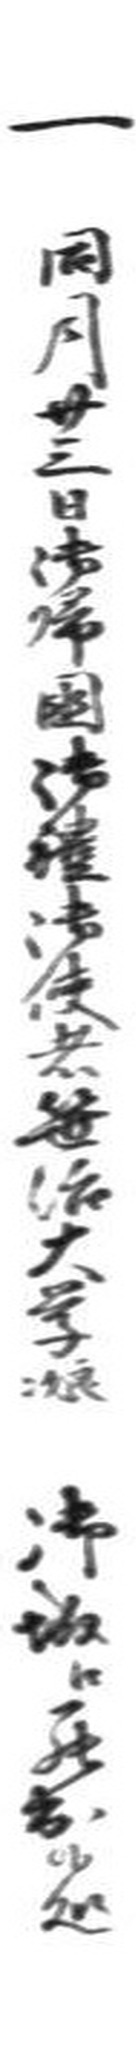一同月廿三日御帰国御礼御使者笹治大学良次御城江罷出候処
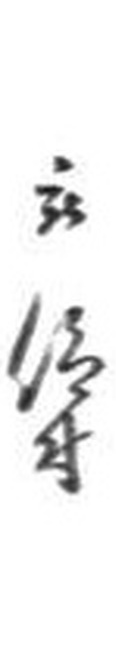被仰付
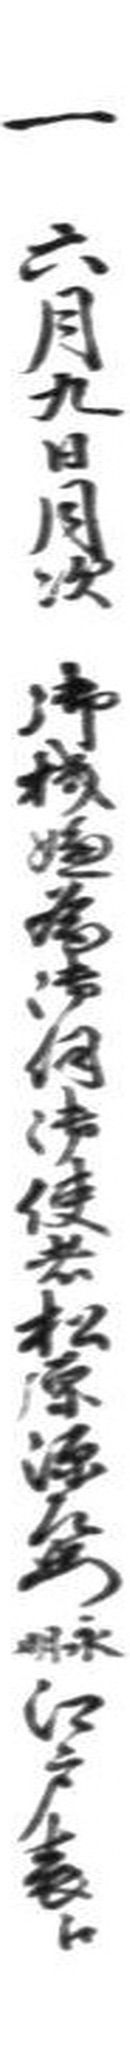一六月九日月次御機嫌為御伺御使者松原源左衛門永明江戸表江
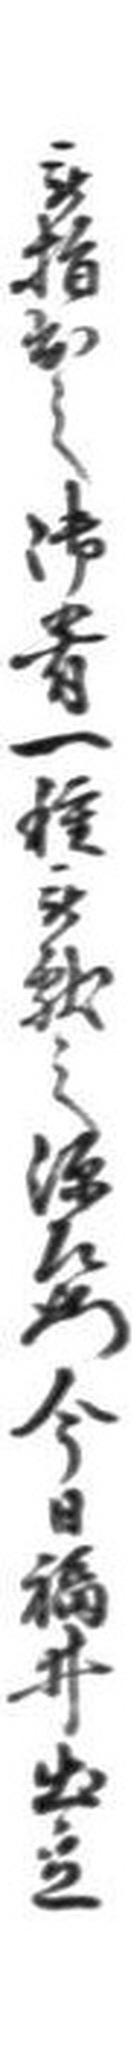被指出之御肴一種被献之源左衛門今日福井出立

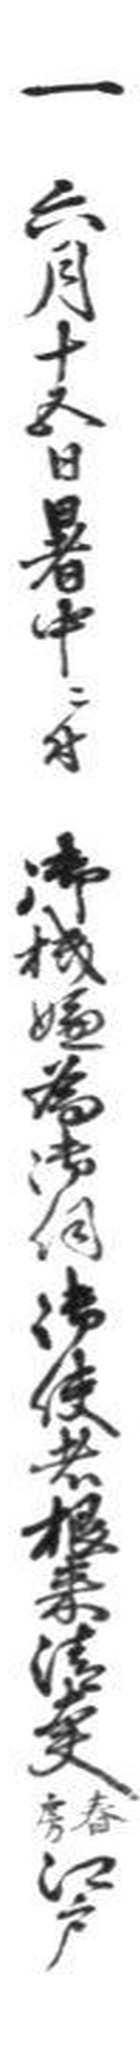一六月十五日暑中ニ付御機嫌為御伺御使者根来清太夫春房江戸
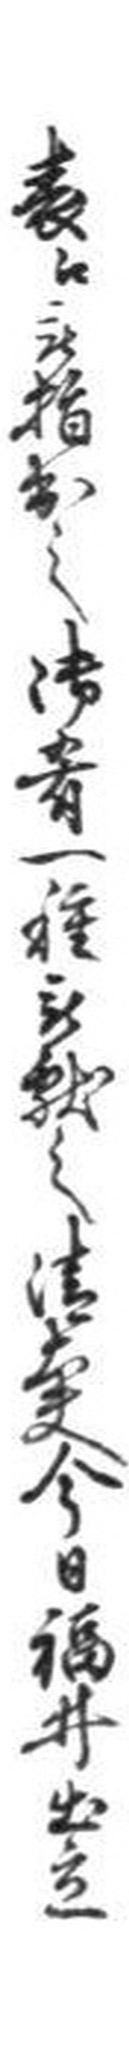表江被指出之御肴一種被献之清太夫今日福井出立
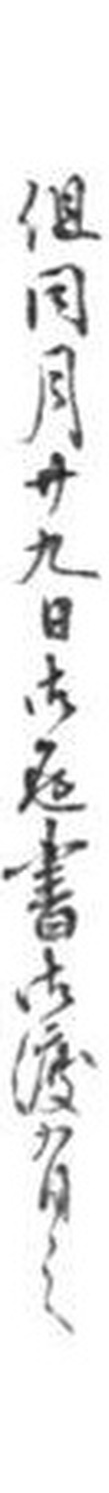但同月廿九日御返書御渡有之
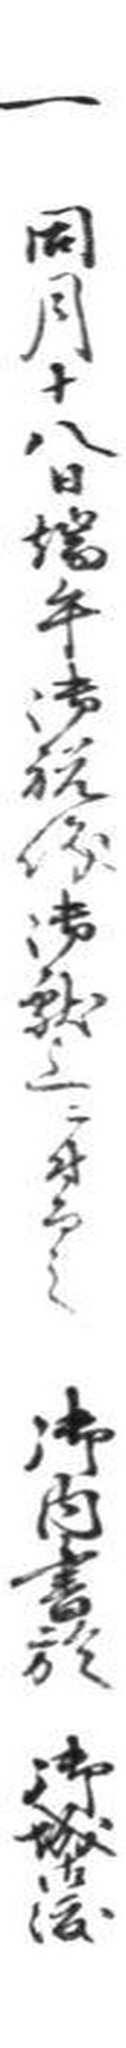一同月十八日端午御祝儀御献上ニ付而之御内書於御城御渡
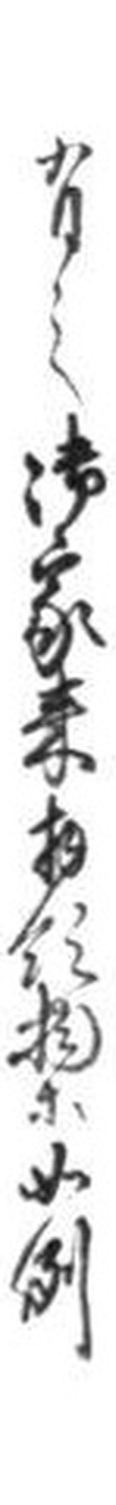有之御家来拝領物等如例
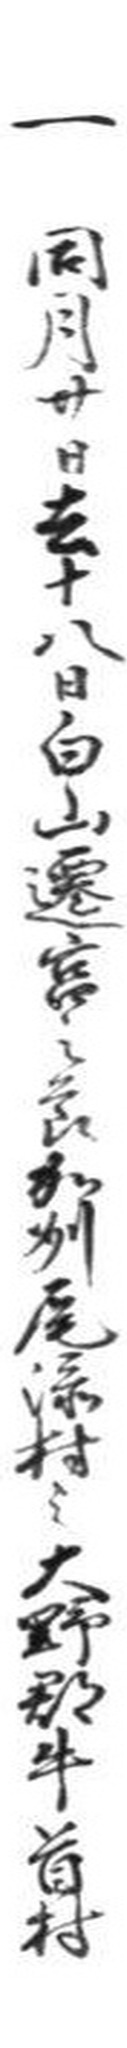一同月廿日去十八日白山遷宮之節加州尾添村之大野郡牛首村
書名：家譜 二十一 吉品公 従元禄十三年到同十四年
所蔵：福井県文書館 Fukui Prefectural Archives
